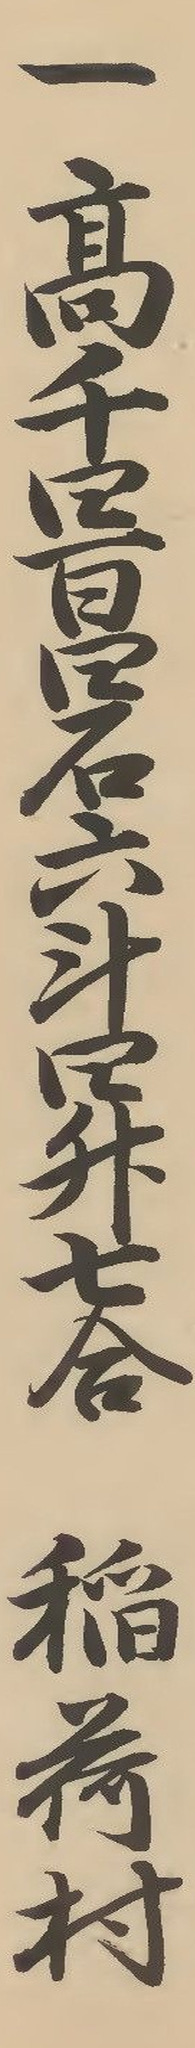一高千四百四石六斗四升七合稲荷村
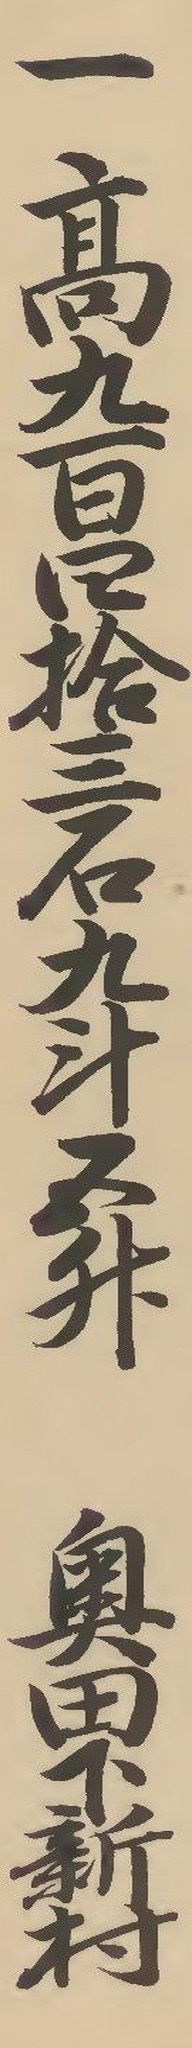一高九百四拾三石九斗五升奥田下新村

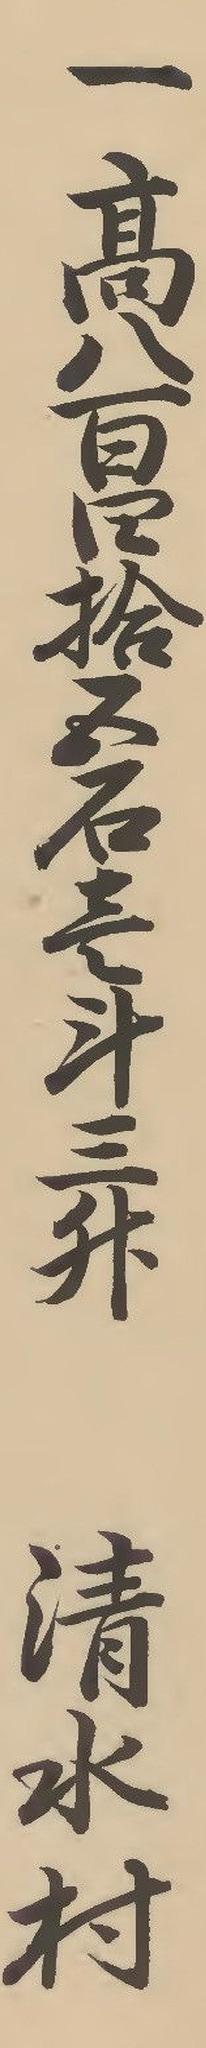一高八百四拾五石壱斗三升清水村
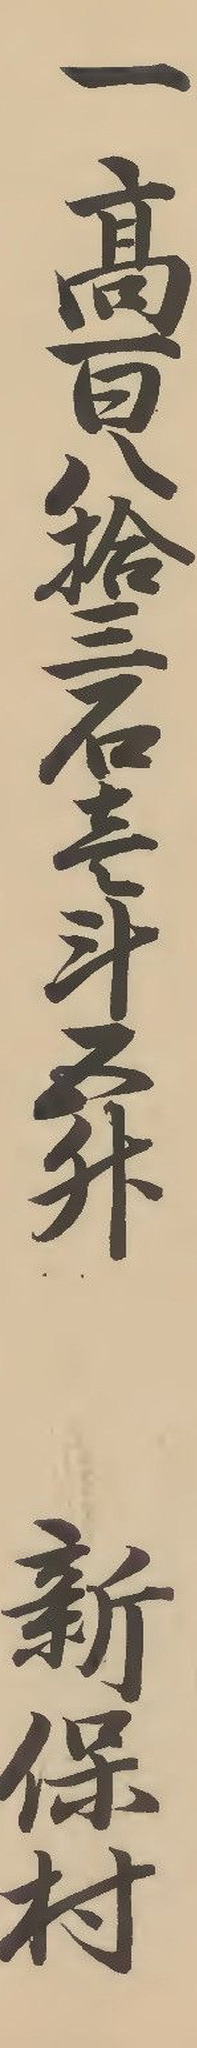一高百八拾三石壱斗五升新保村
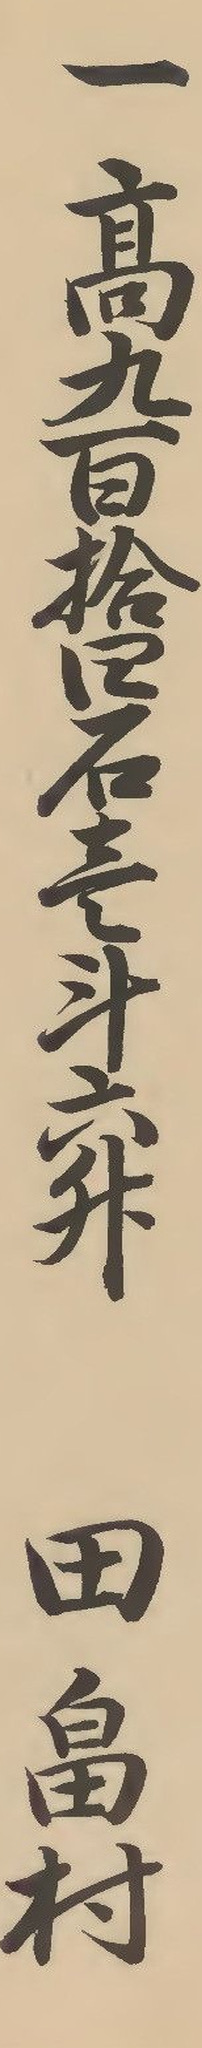一高九百拾四石壱斗六升田畠村
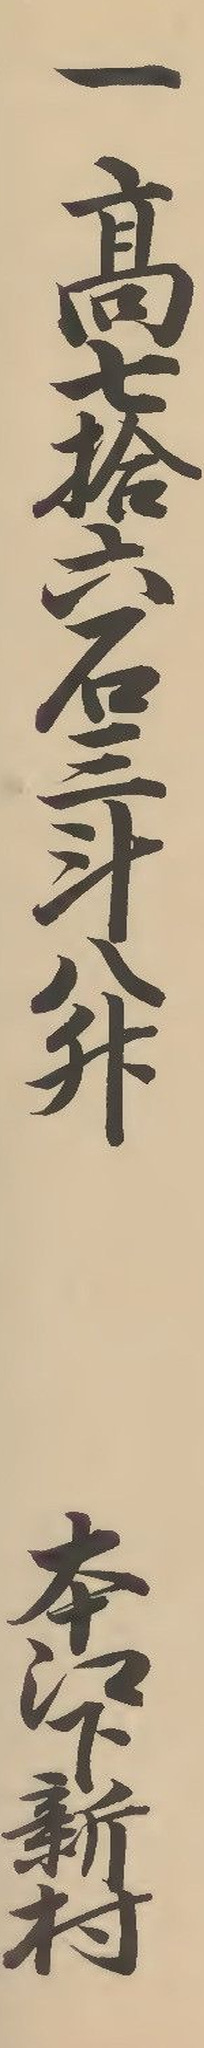一高七拾六石三斗八升本江下新村
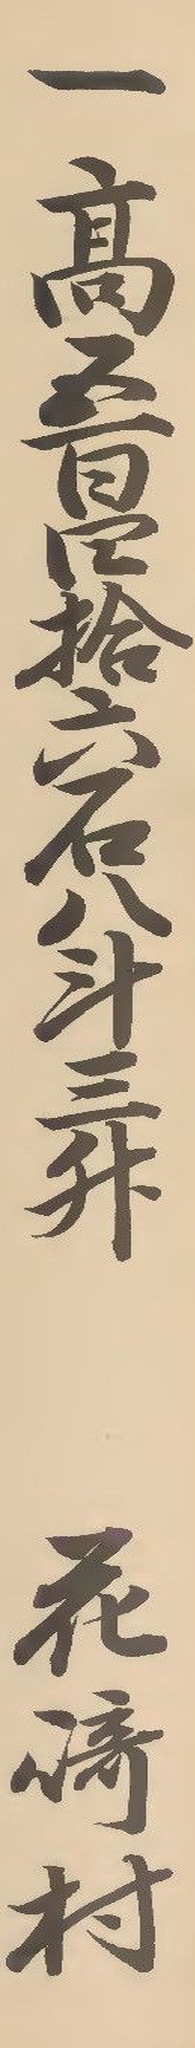一高五百四拾六石八斗三升花崎村
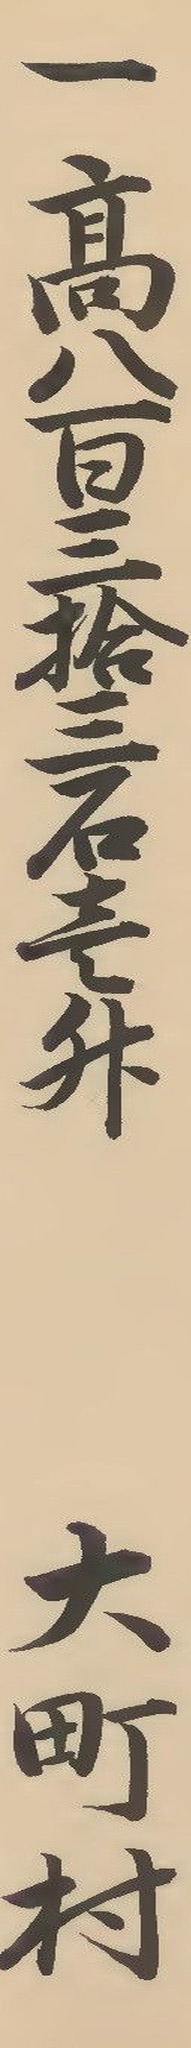一高八百三拾三石壱升大町村
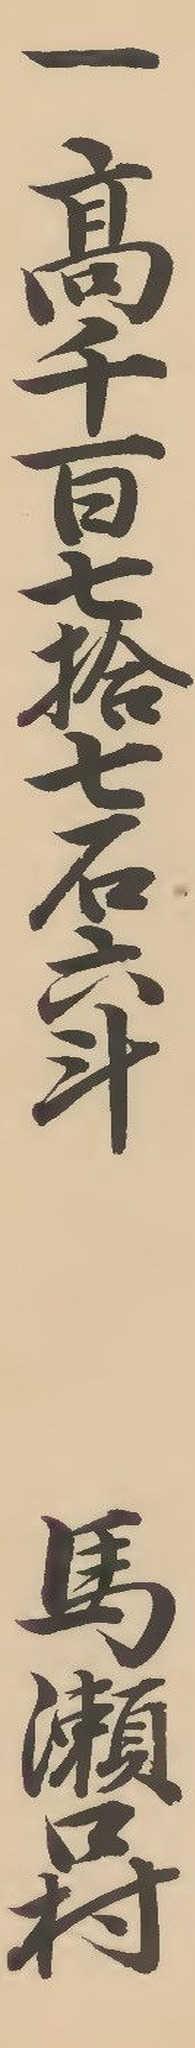一高千百七拾七石六斗馬瀬口村

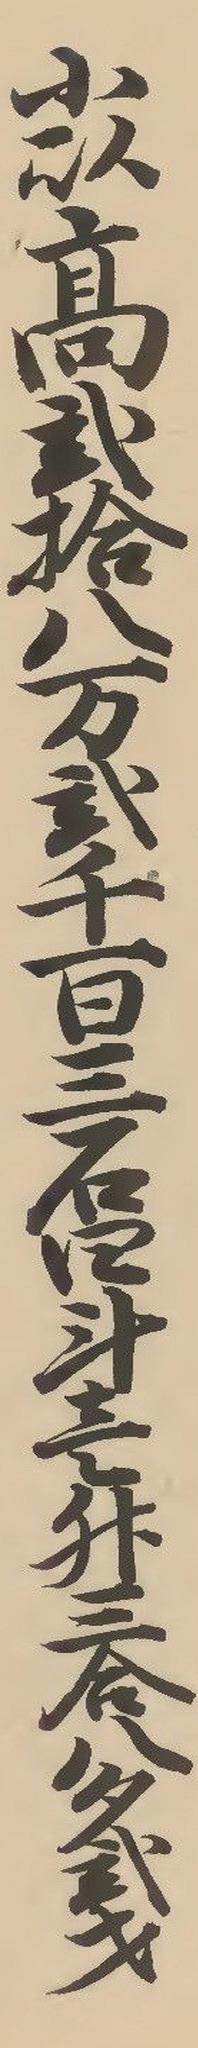小以高弐拾八万弐千百三石四斗壱升三合八勺弐才

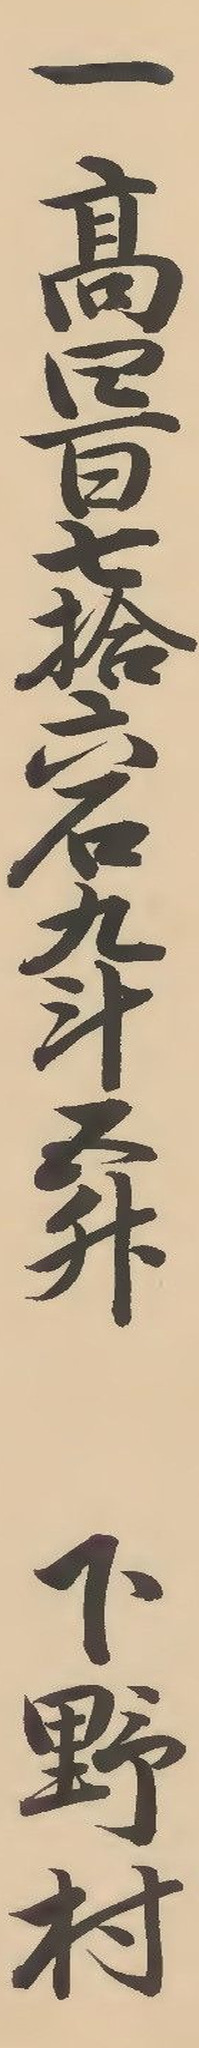一高四百七拾六石九斗五升下野村
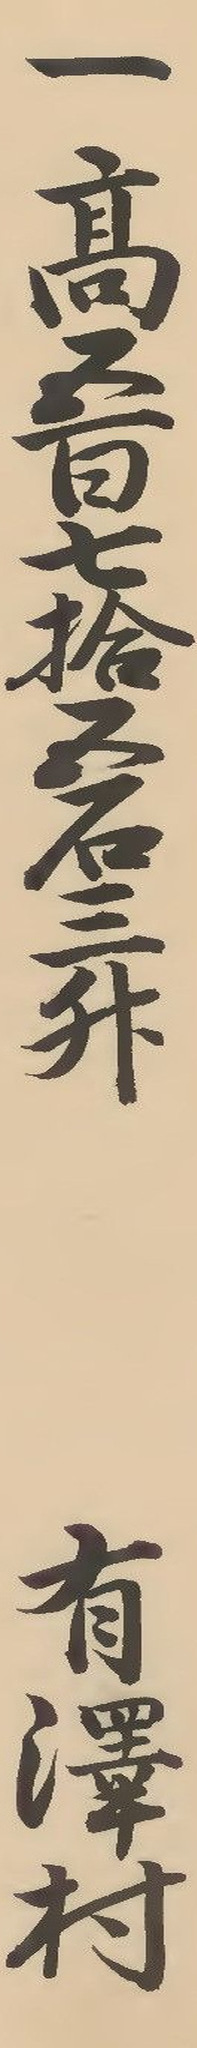一高五百七拾五石三升有沢村
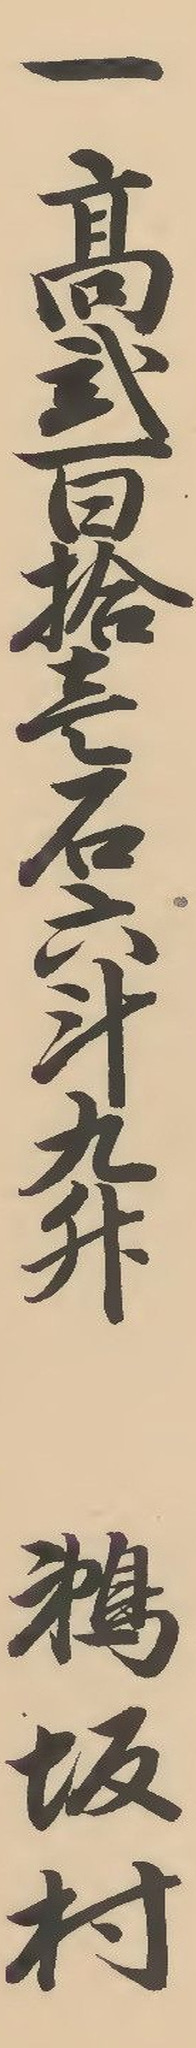一高弐百拾壱石六斗九升鵜坂村

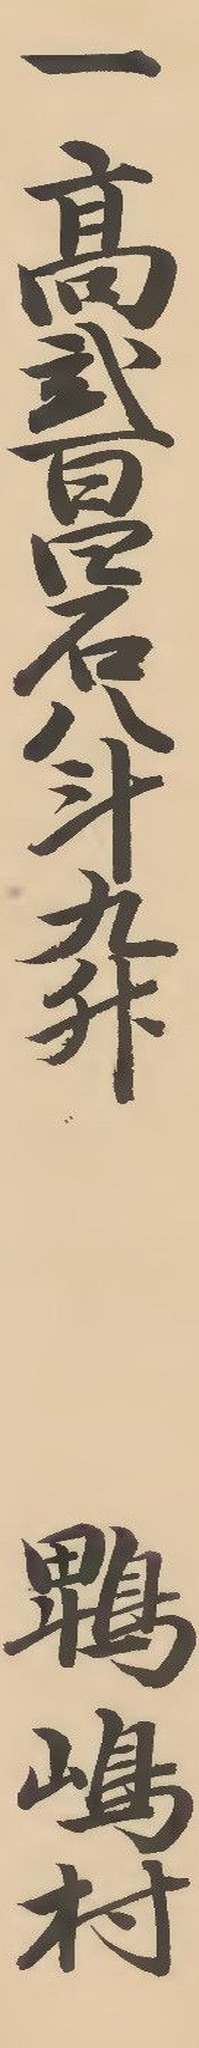一高弐百四石八斗九升鵯島村
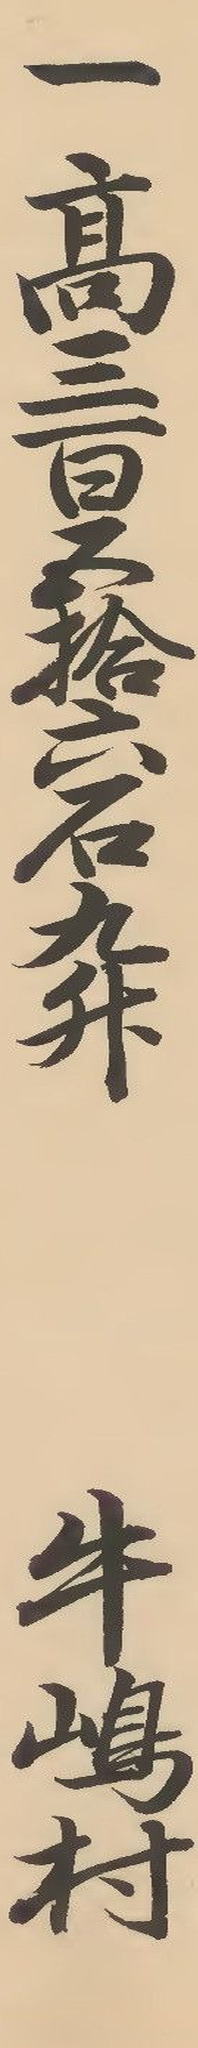一高三百五拾六石九升牛島村
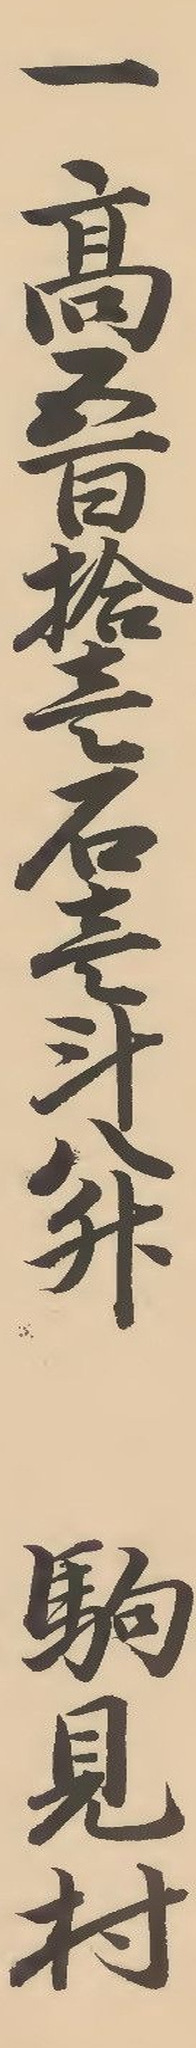一高五百拾壱石壱斗八升駒見村
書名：越中国郷帳
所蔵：国立公文書館 National Archives of Japan
